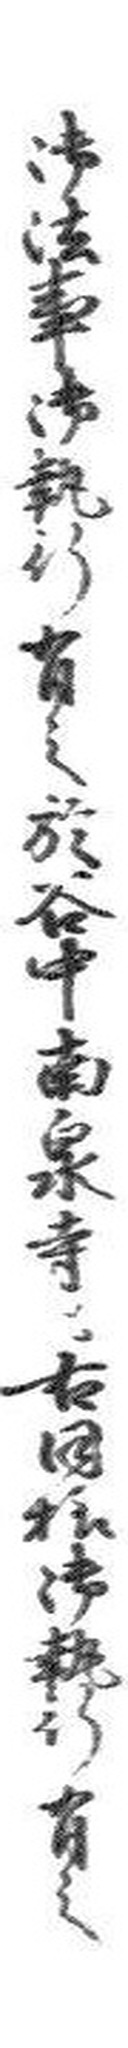御法事御執行有之於谷中南泉寺も右同様御執行有之
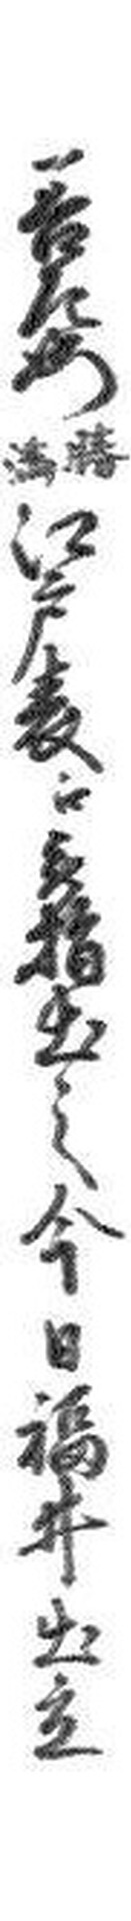善左衛門勝満江戸表江被指出之今日福井出立
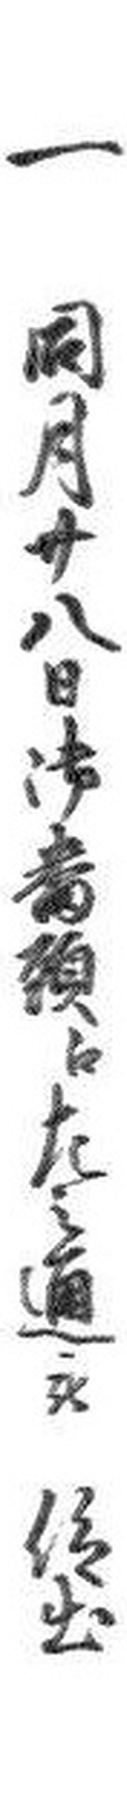一同月廿八日御番頭江左之通被仰出
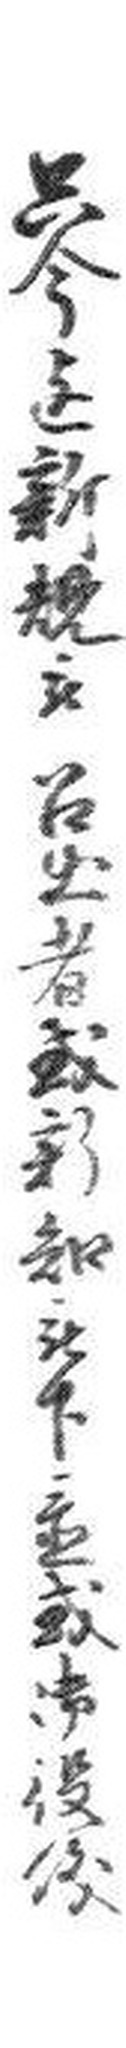只今迄新規被召出者或新知被下置或御役儀
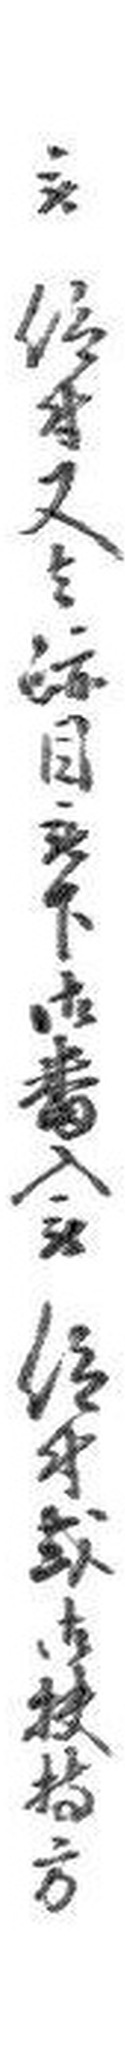被仰付又者跡目被下御番入被仰付或御扶持方
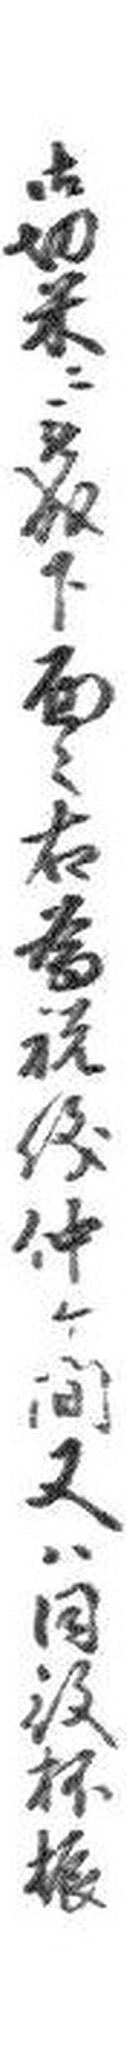御切米ニ被成下面々右為祝儀仲ヶ間又ハ同役等振

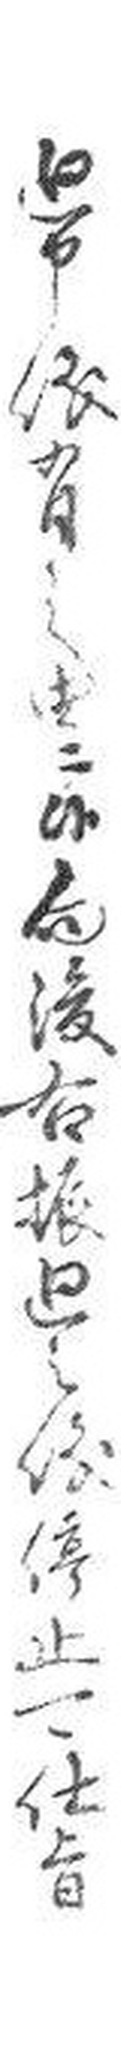廻申儀有之由ニ候向後右振廻之儀停止可仕旨
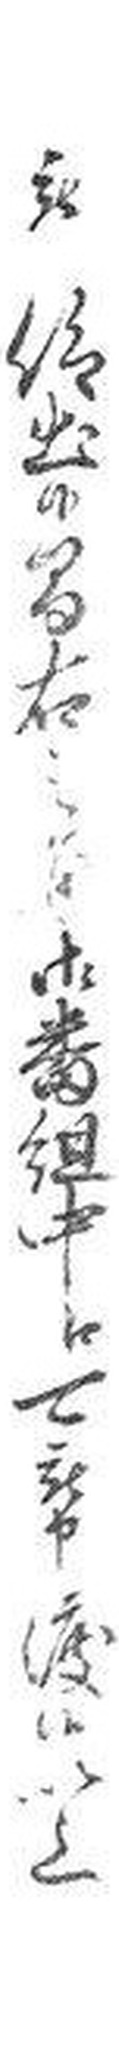被仰出候間右之旨御番組中江可被申渡候以上
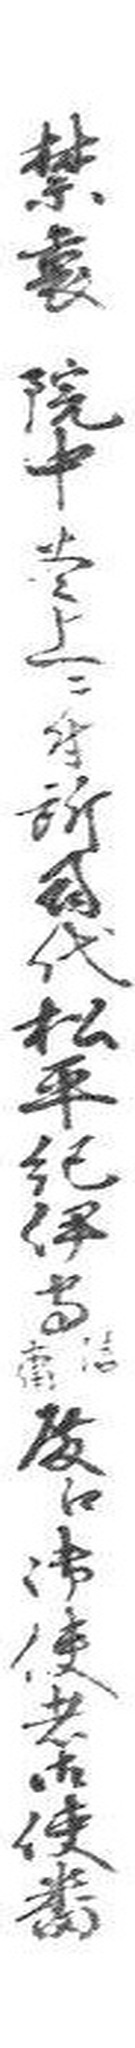禁裏院中炎上ニ付所司代松平紀伊守信庸殿江御使者御使番
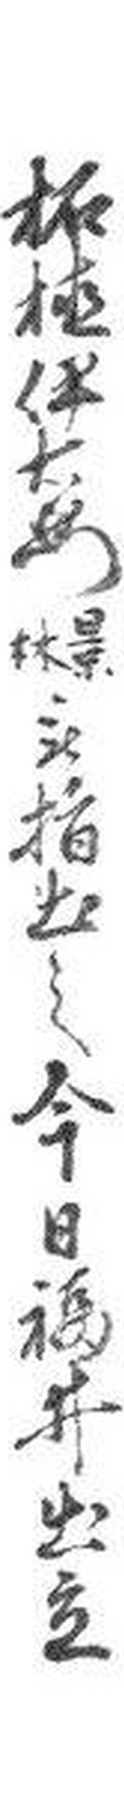柘植伊右衛門景林被指出之今日福井出立
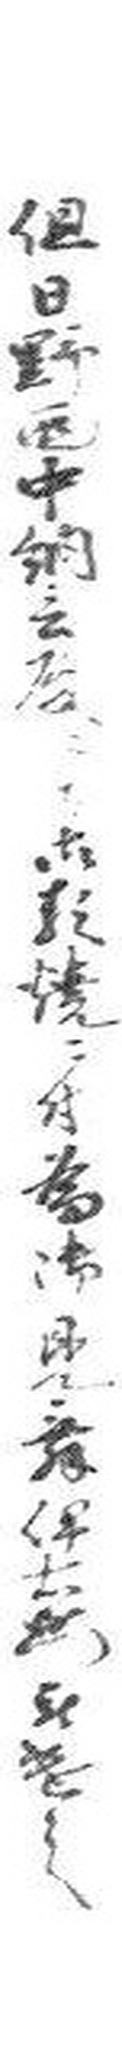但日野西中納言殿ニも御類焼ニ付為御見舞伊右衛門被遣之
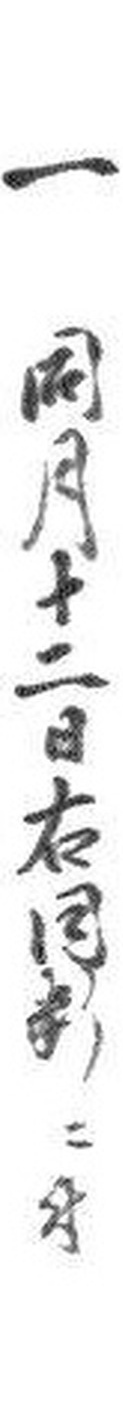一同月十二日右同断ニ付
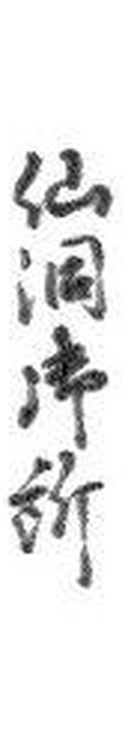仙洞御所
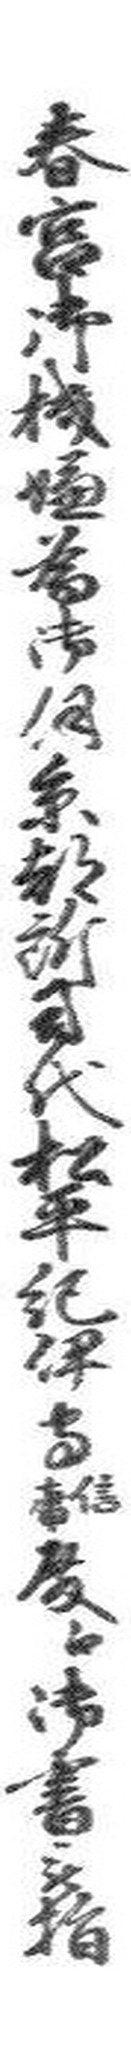春宮御機嫌為御伺京都所司代松平紀伊守信庸殿江御書被指
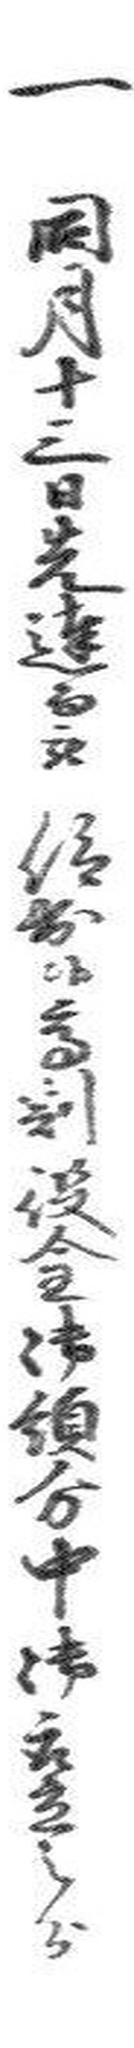一同月十三日先達而被仰出候高割役金御領分中御取立之分
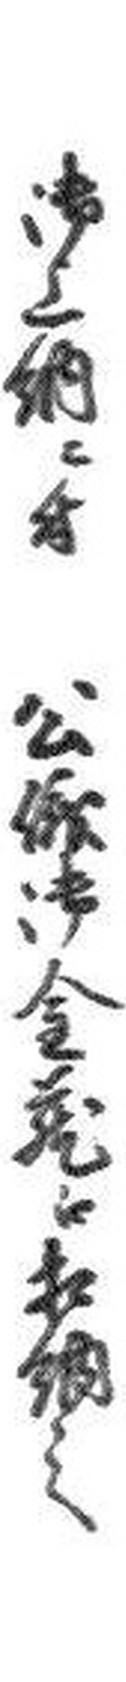御上納ニ付公儀御金蔵江相納之
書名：家譜 二十四 吉品公 従宝永三年到同五年
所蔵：福井県文書館 Fukui Prefectural Archives
